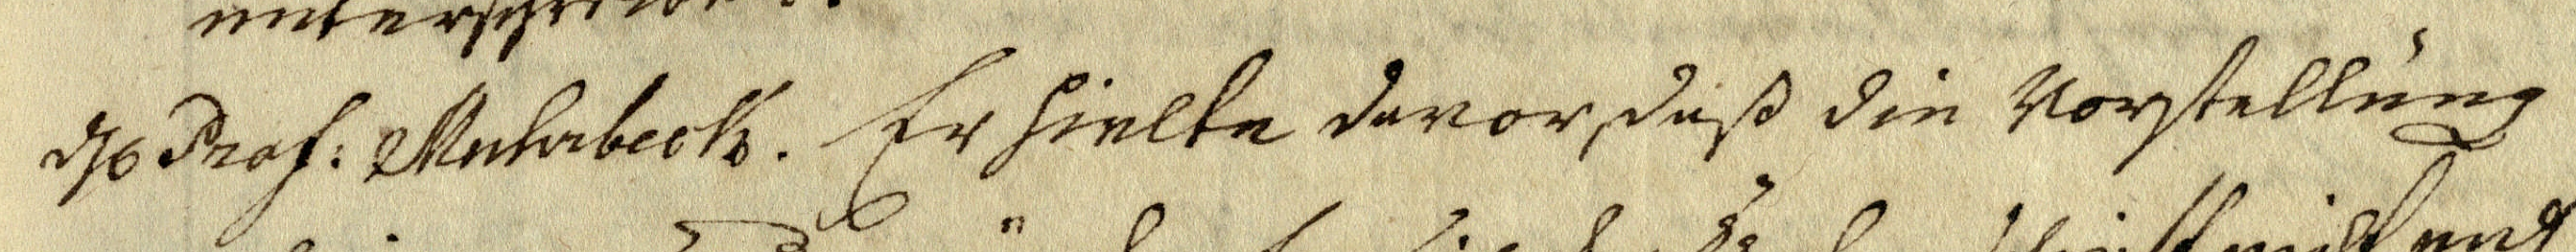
dh. Prof. Muhrbeck. Er hielte davor, daß die Vorstellung
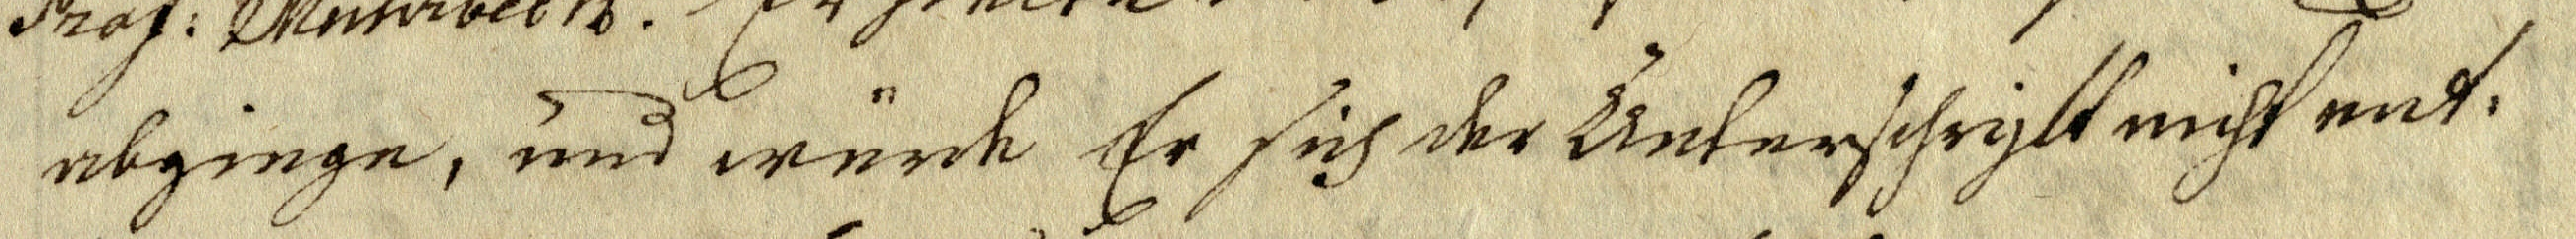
abginge, und würde Er sich der Untrschrift nicht ent¬
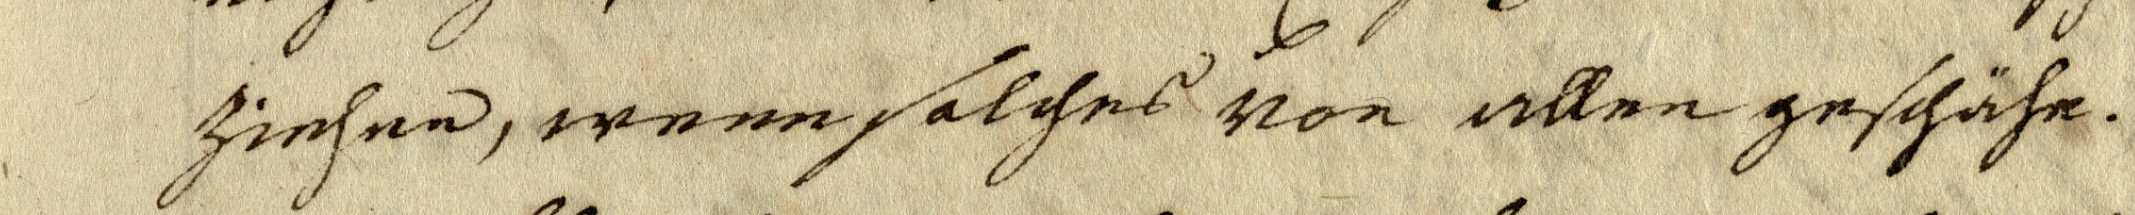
ziehen, wenn solches von allen geschähe.
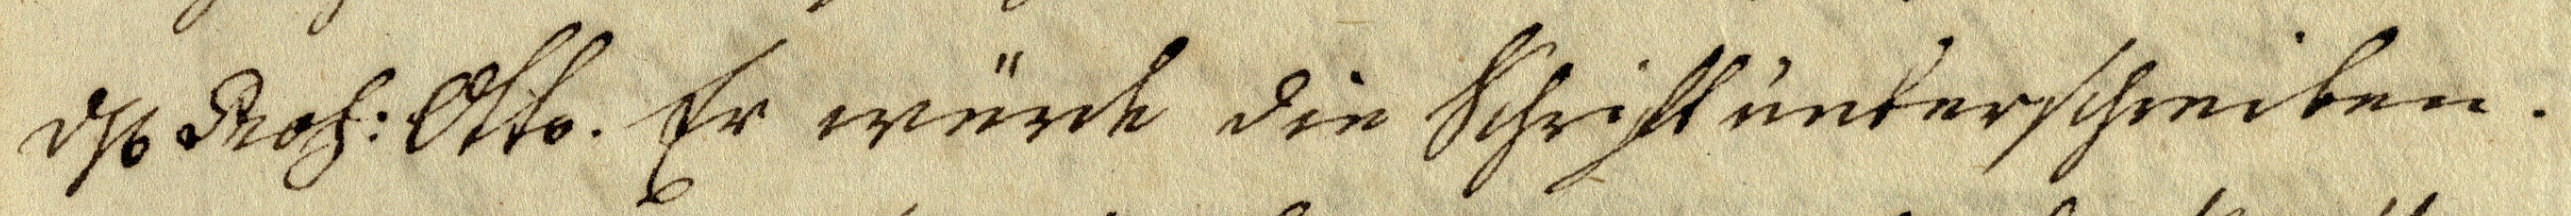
dh Prof. Otto. Er würde die Schrift unterschreiben.
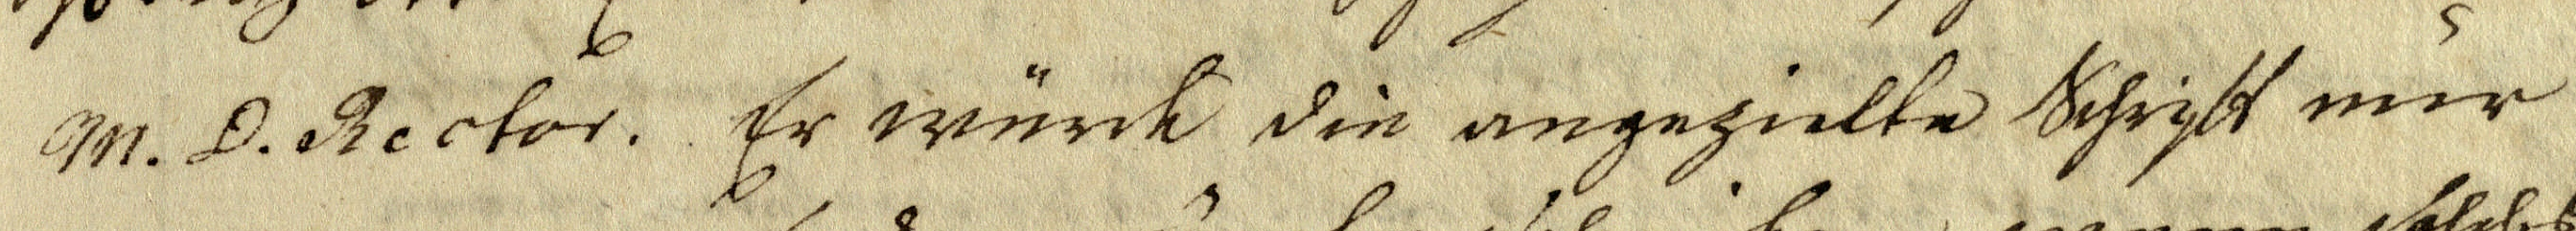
M. D. Rector. Er würde die angezielte Schrift nur
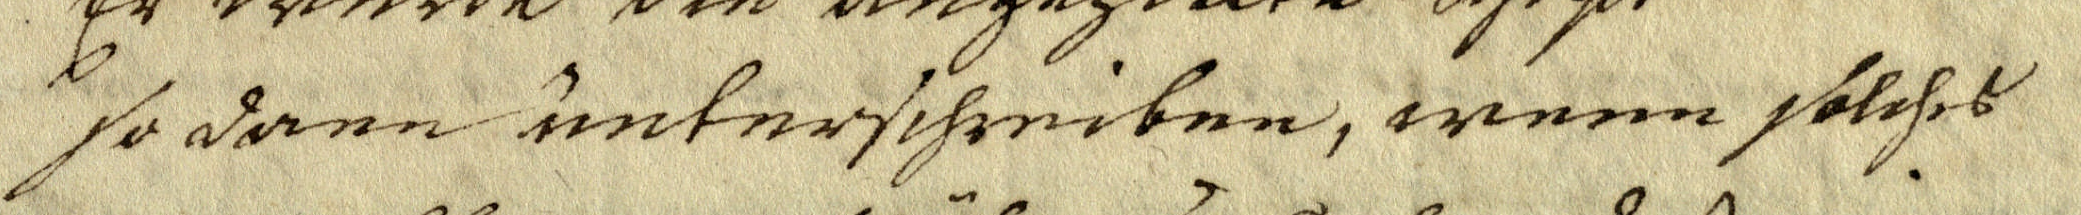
so dann unterschreiben, wenn solches
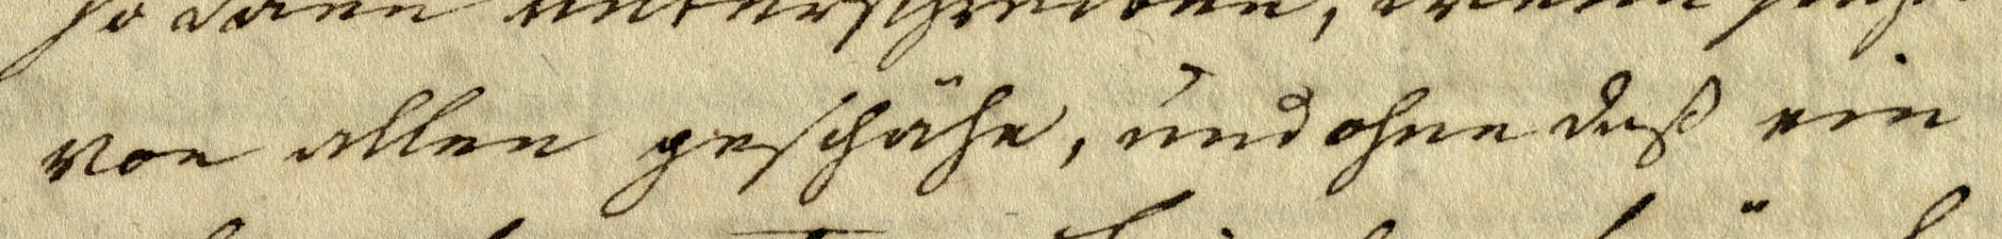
von allen geschähe, und ohne daß ein
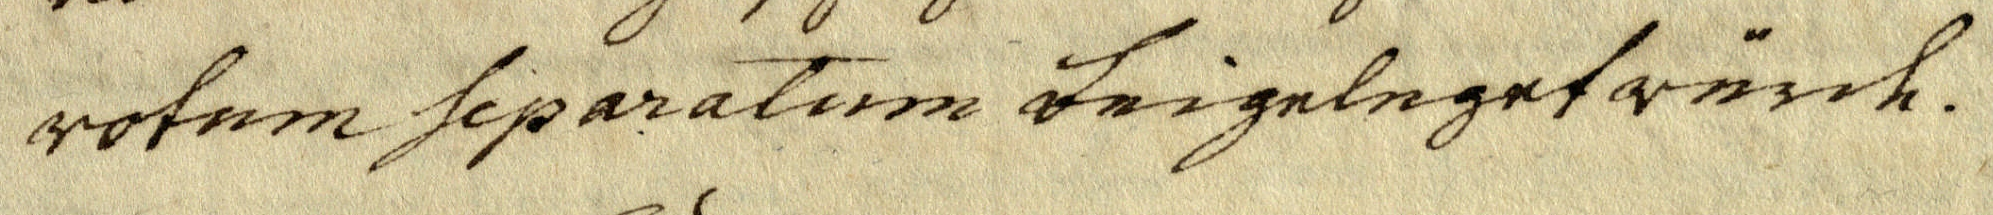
votum separatum beigeleget würde.
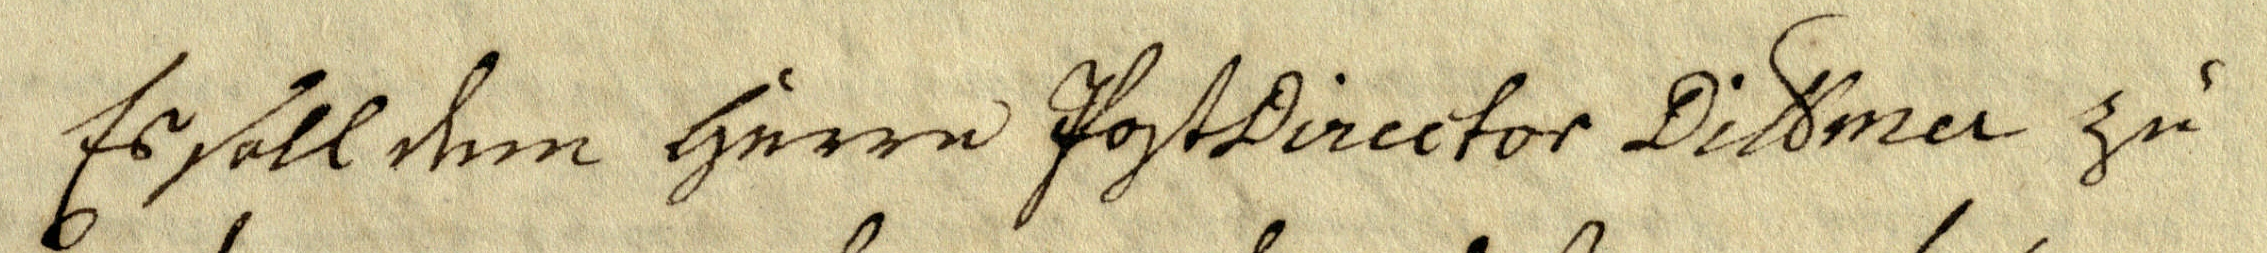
Es soll dem Herrn PostDirector Dittmer zu
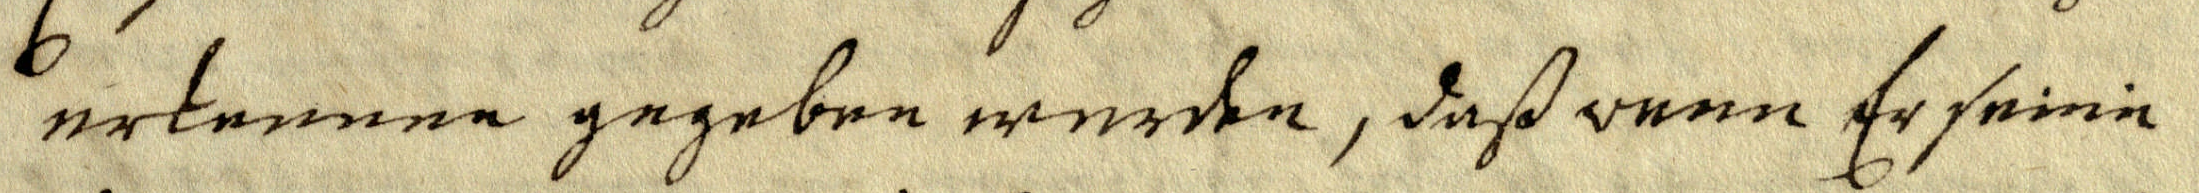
erkennen gegeben werden, daß wenn Er seine
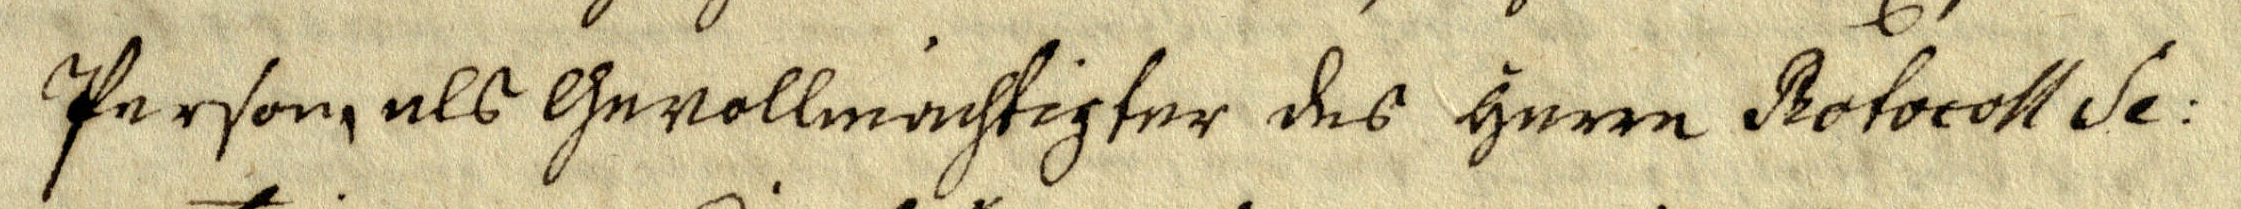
Person, als Gevollmächtigter der Herrn Protocoll Se¬
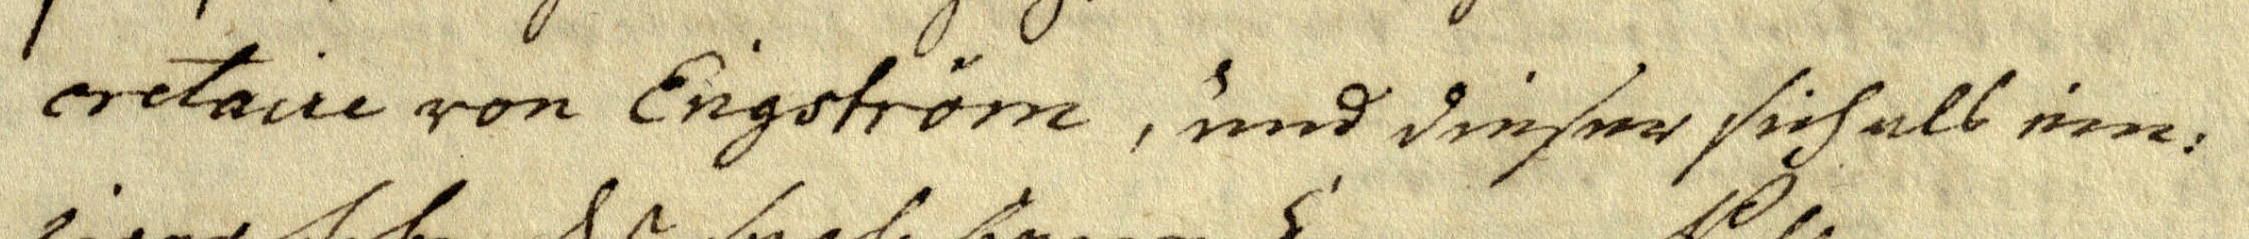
cretaire von Engström, und dieser sich als ein¬
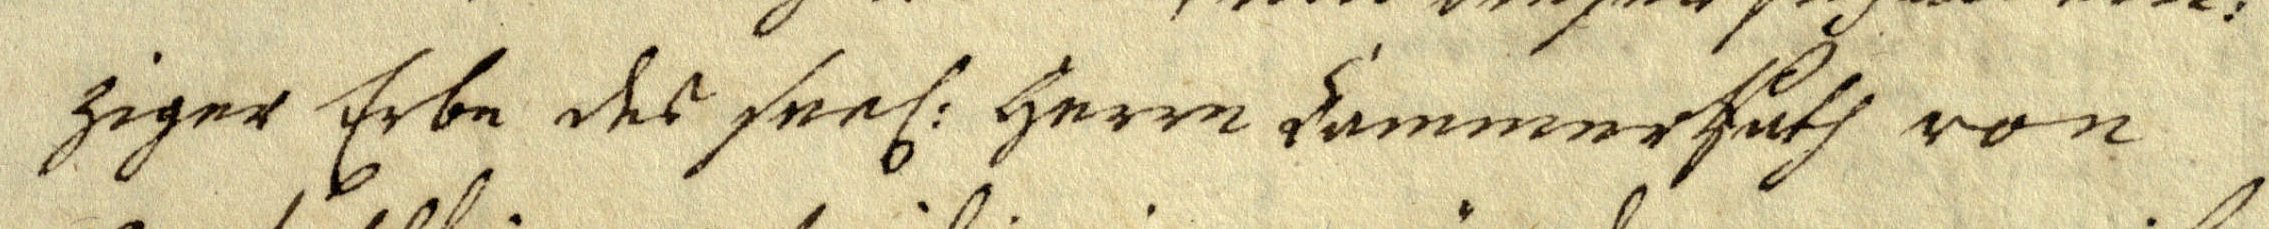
ziger Erbe des seel. Herrn CammerRath von
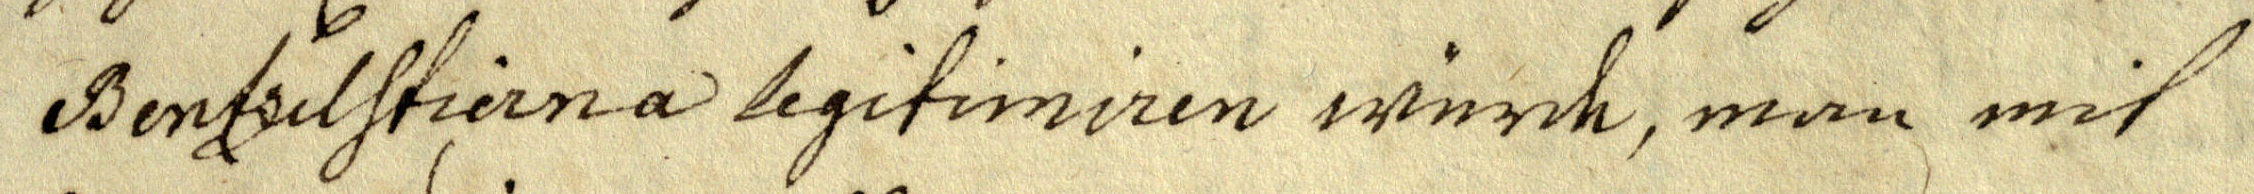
Bentzelstierna legitimiren würde, man mit
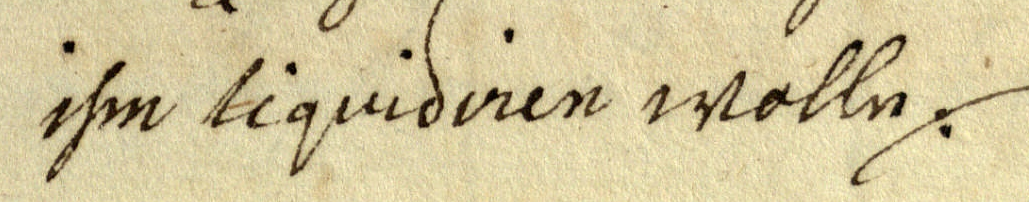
ihm liquidiren wolle.
